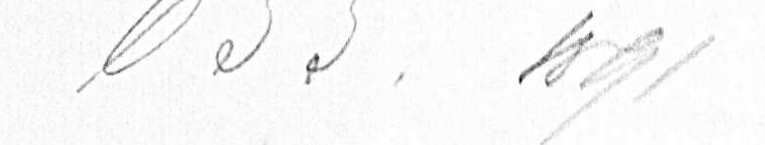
655. B91
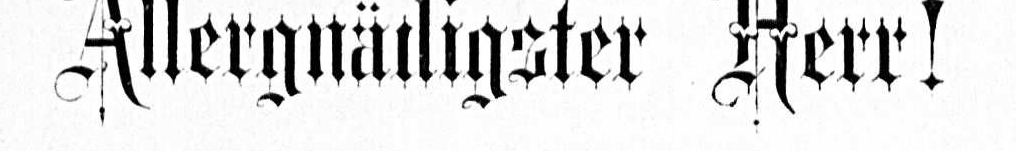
Akkergnärligster Herr!
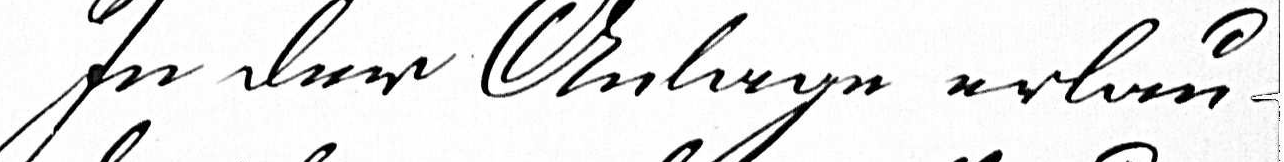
Ub der Anlage erlau¬
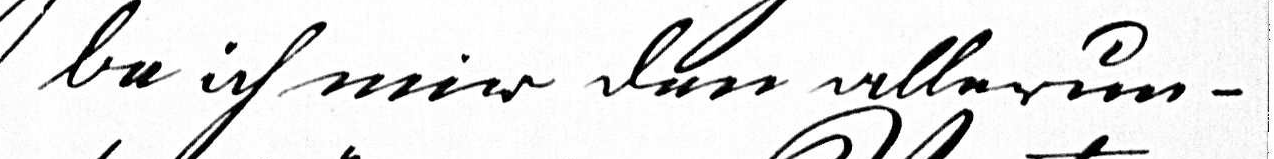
be ich mies den allerun¬
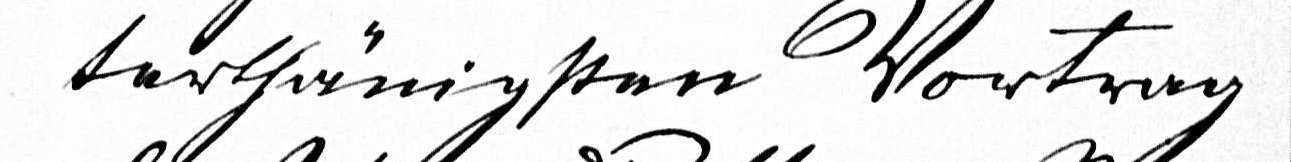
terthänigssen Vortrag
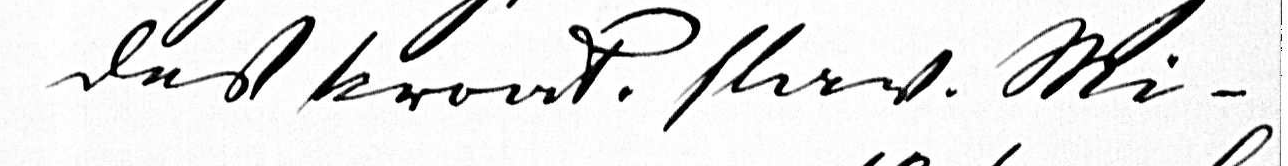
des kroat. Starw. Mi¬
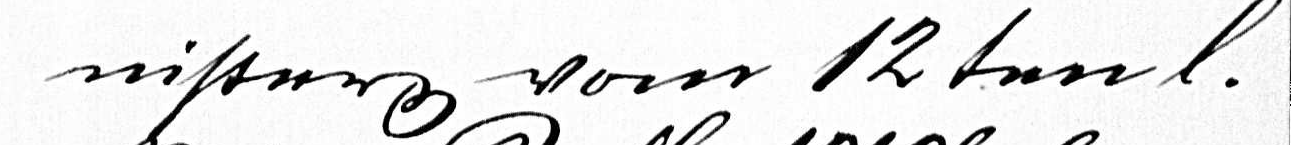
mister vom 12 ten l.
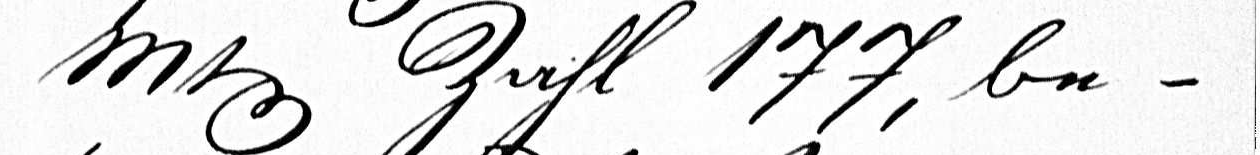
Mr Zahl 177, be¬
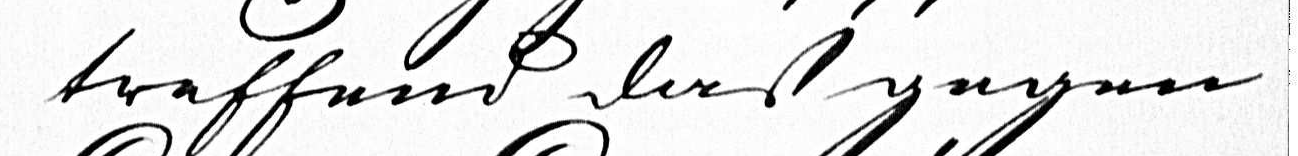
traffend das gegen
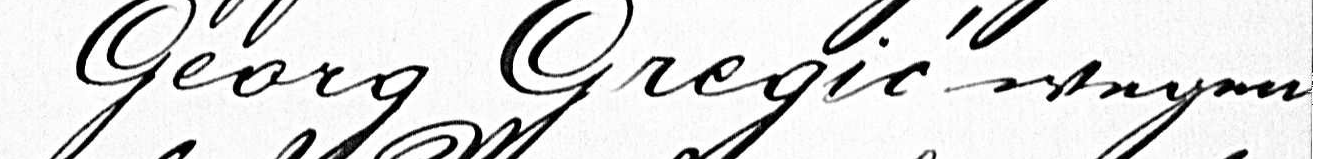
Georg Gregic wegen
